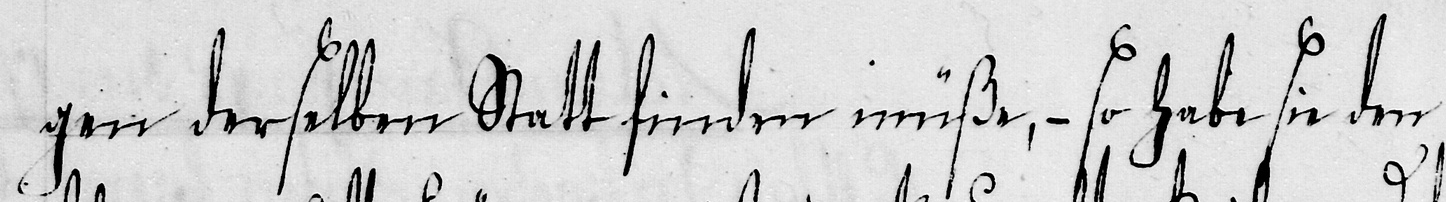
gen derselben Statt finden müße, – so habe sie
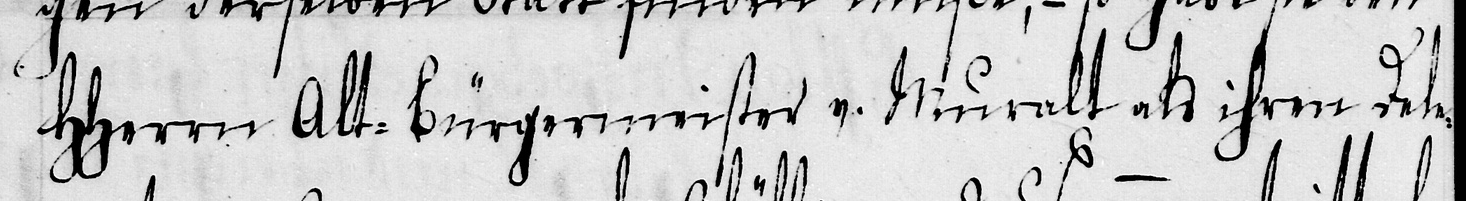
HHerrn Alt-Bürgermeister v. Muralt als ihren Del¬
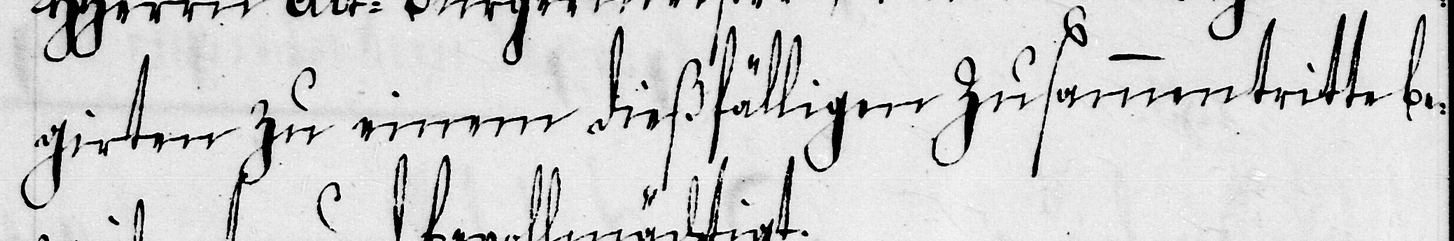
egirten zu einem dießfälligen Zusammentritte b¬
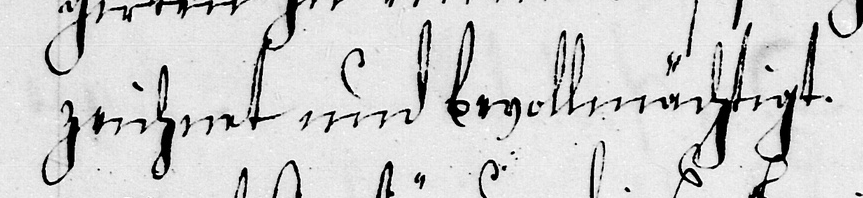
ezeichnet und bevollmächtigt.
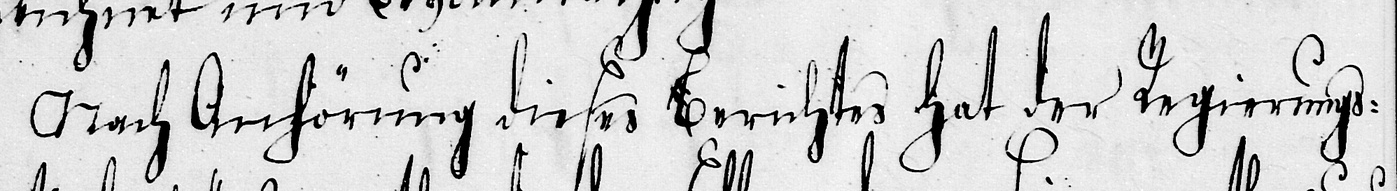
Nach Anhörung diese Berichtes hat der Regierungs¬
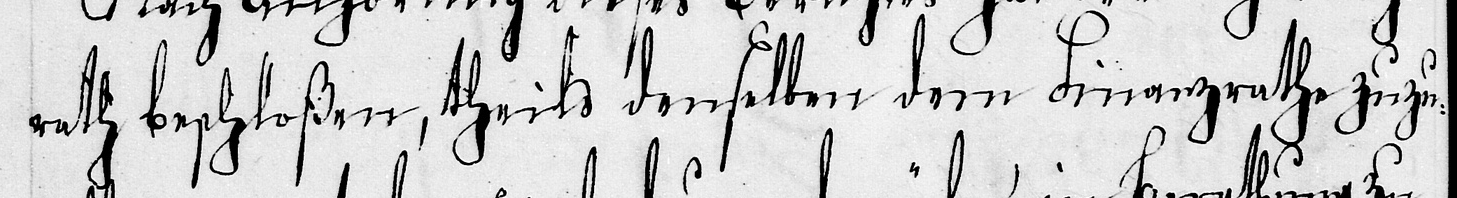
rath beschloßen, theils denselben dem Finanzrathe zuz¬
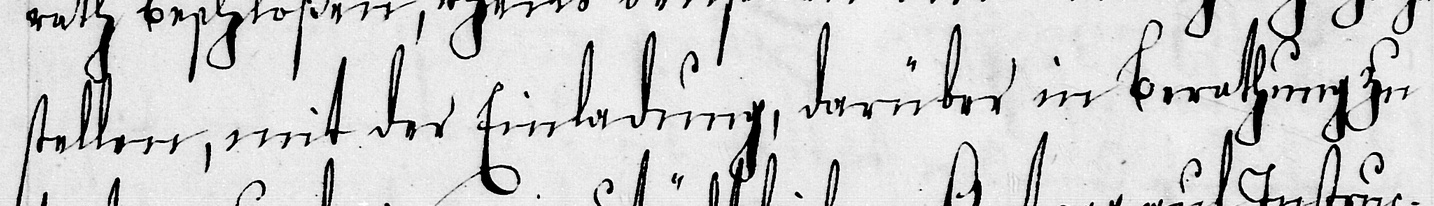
tellen, mit der Einladung, darüber in Berathung zu
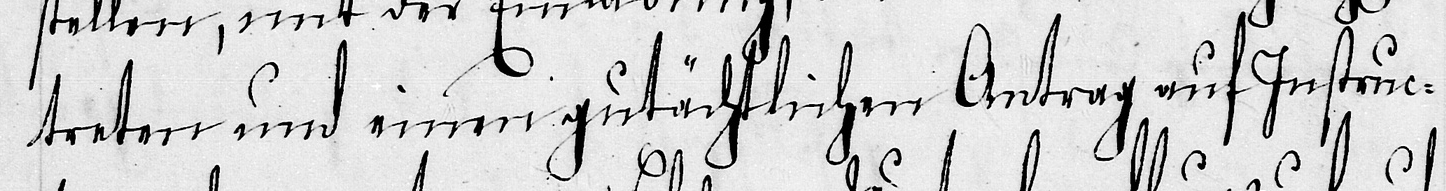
treten und einen gutächtlichen Antrag auf Instruc¬
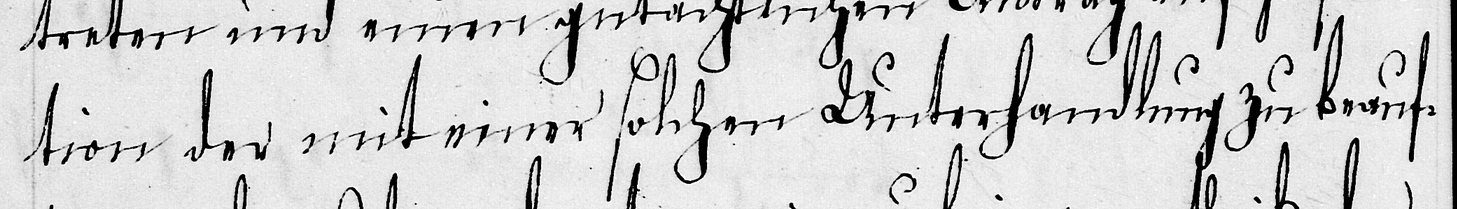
tion der mit einer solchen Unterhandlung zu beauf¬
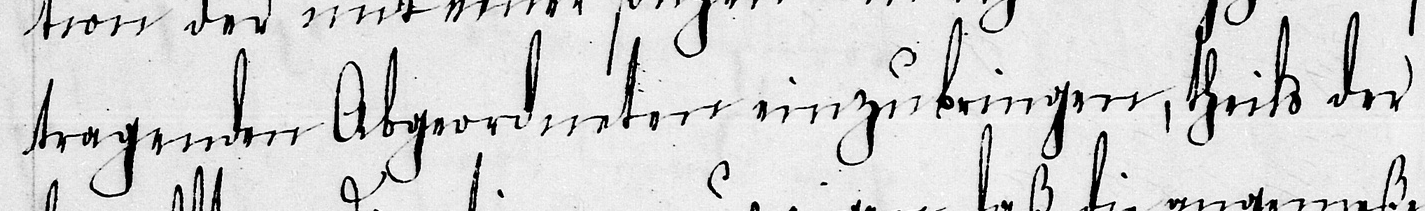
tragenden Abgeordneten einzubringen, theils der
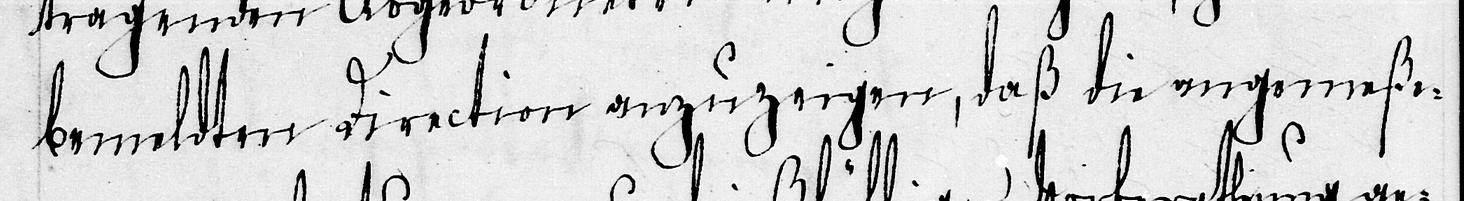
bemeldten Direction anzuzeigen, daß die angemeße¬
